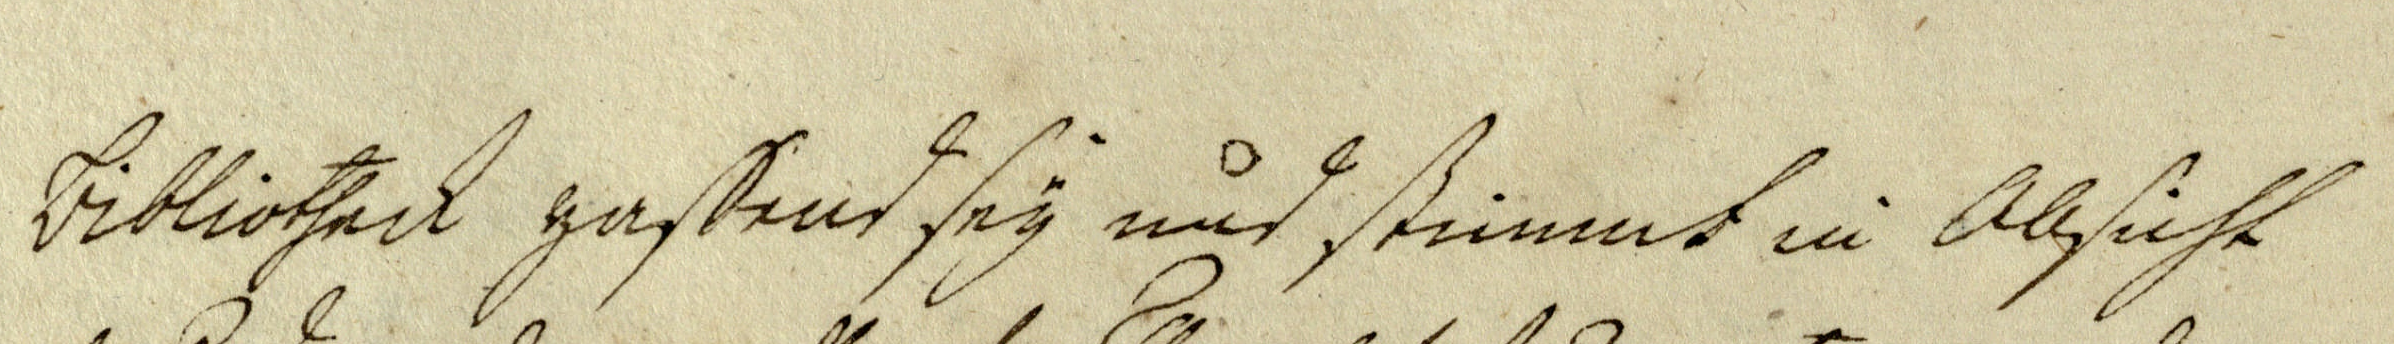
Bibliotheck passend seÿ und stimmt in Absicht
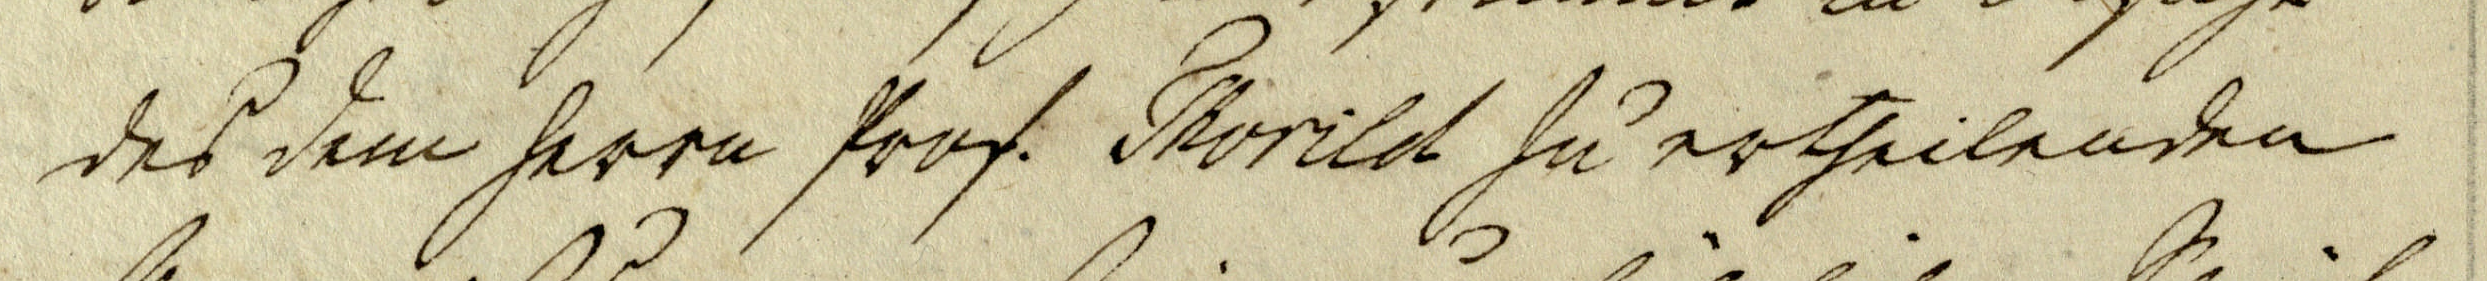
des dem Herrn Prof. Thorild zu ertheilenden
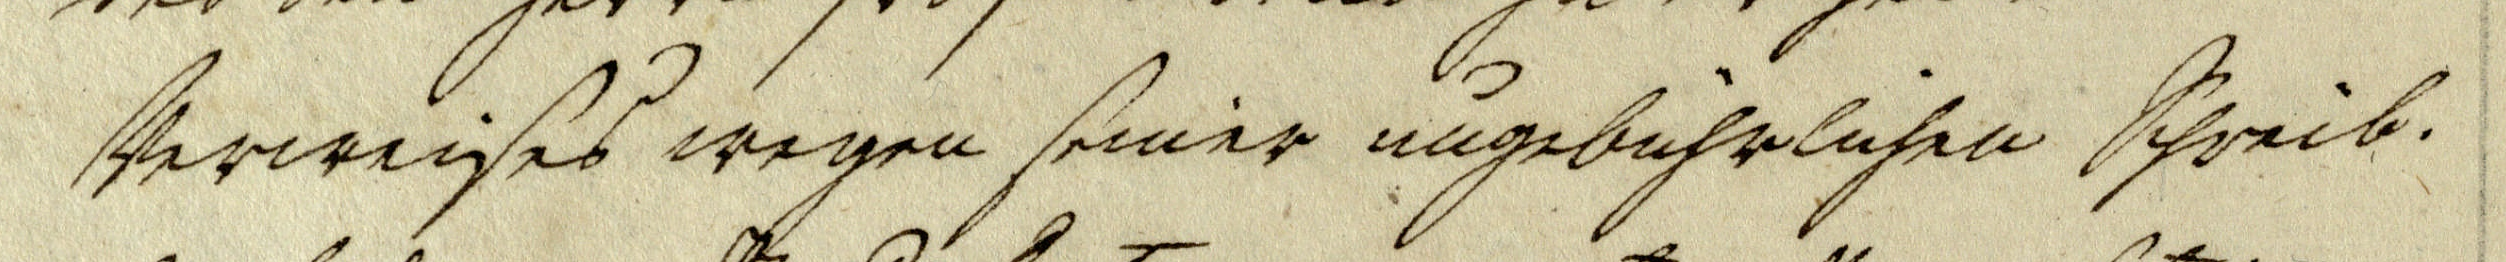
Verweises wegen seiner ungebührlichen Schreib
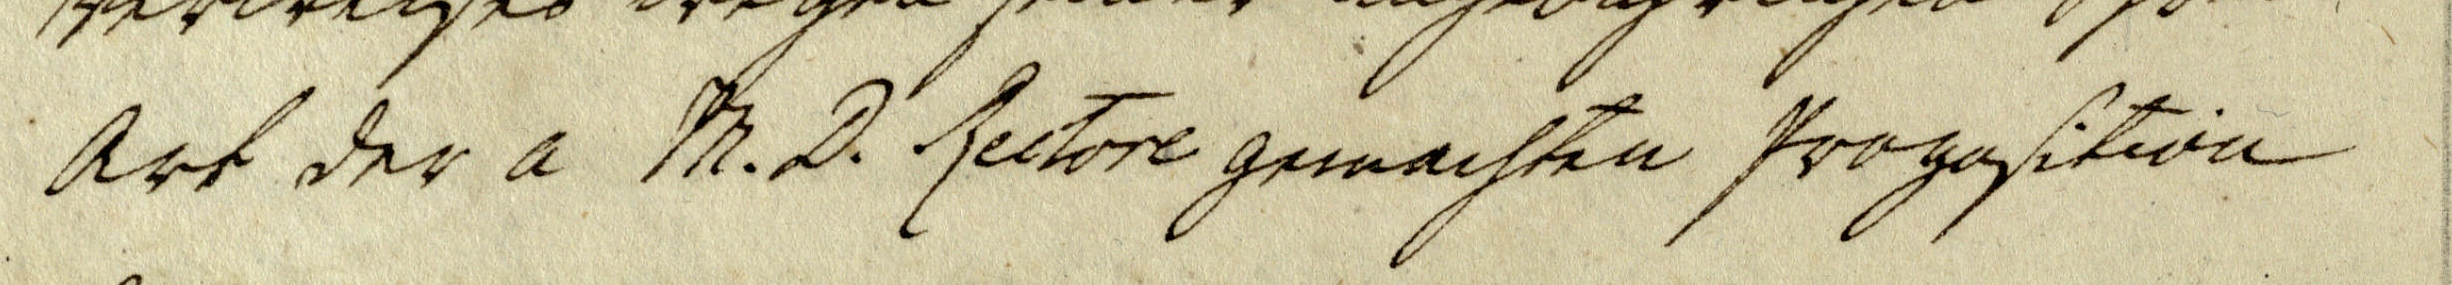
Art der a M. D. Rectore gemachten Proposition
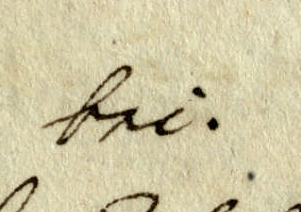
bei.
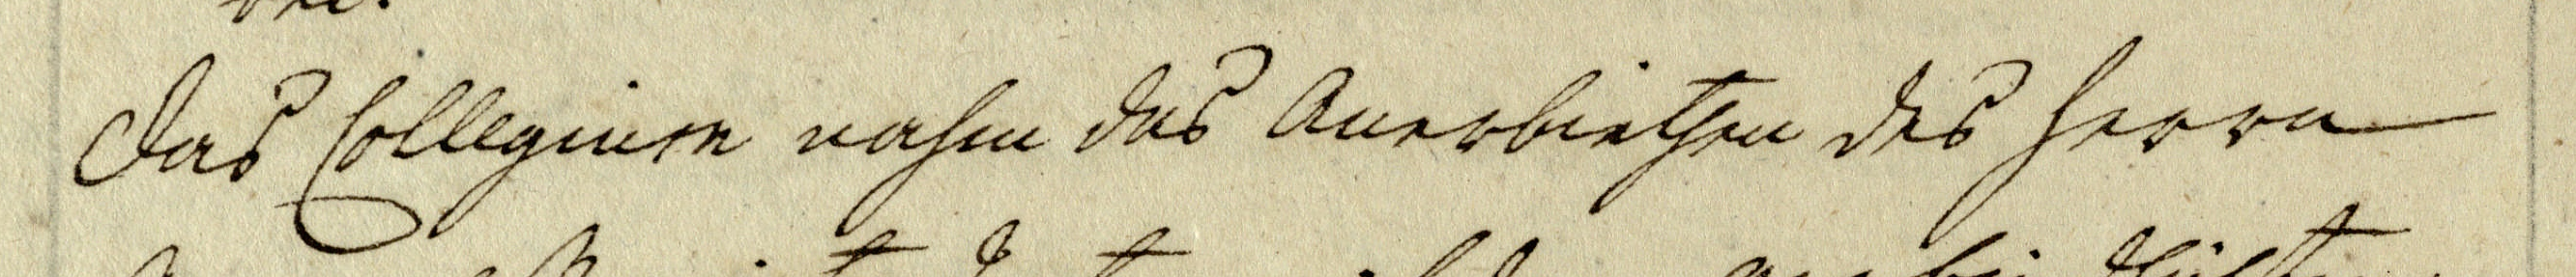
Das Collegium nahm das Anerbiethen des Herrn
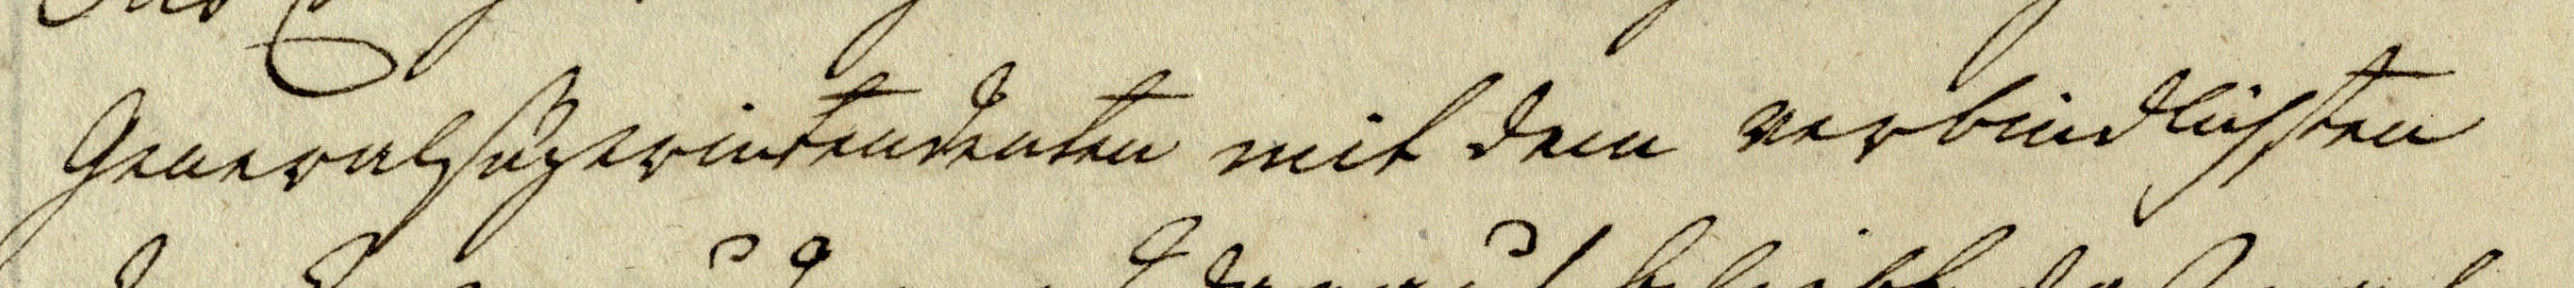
Generalsuperintendenten mit dem verbindlichsten
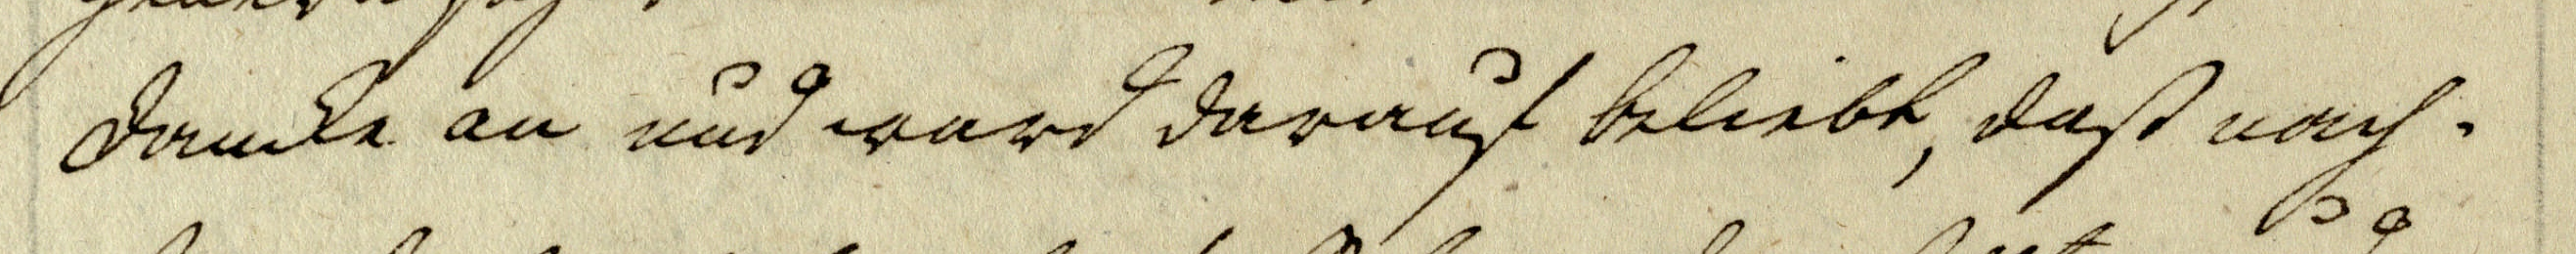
Dancke an und ward darauf beliebt, daß nach¬
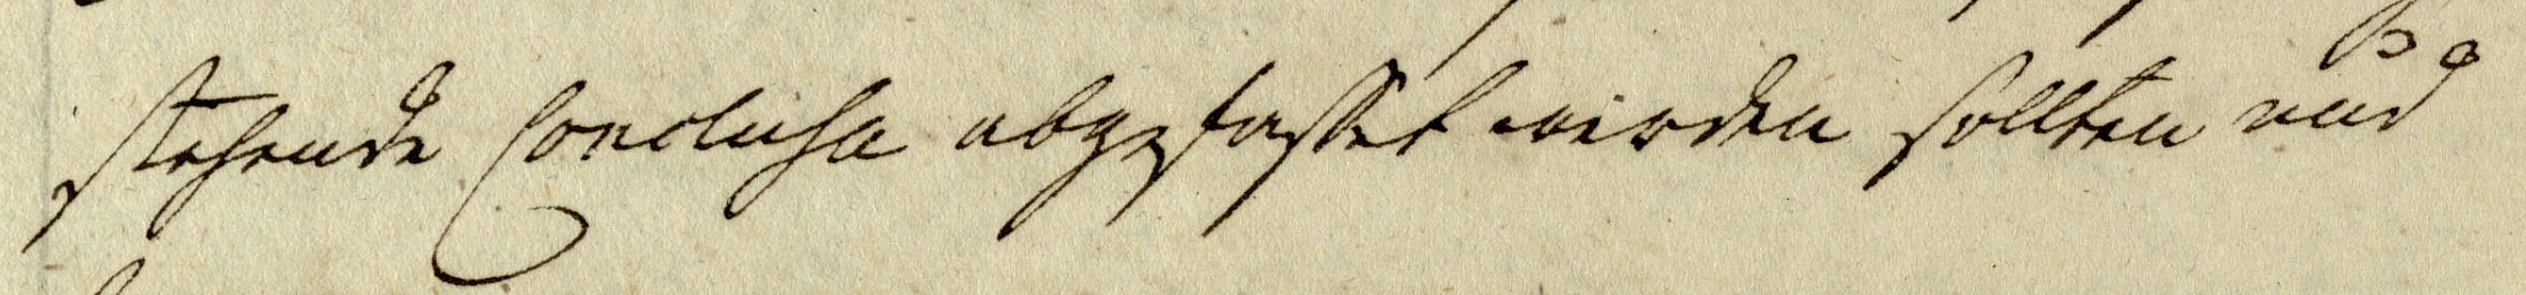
stehende Conclusa abgefasset werden sollten und
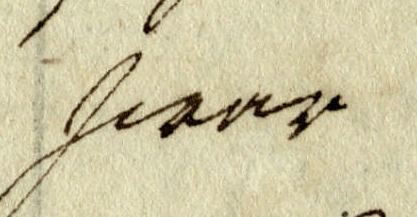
zwar
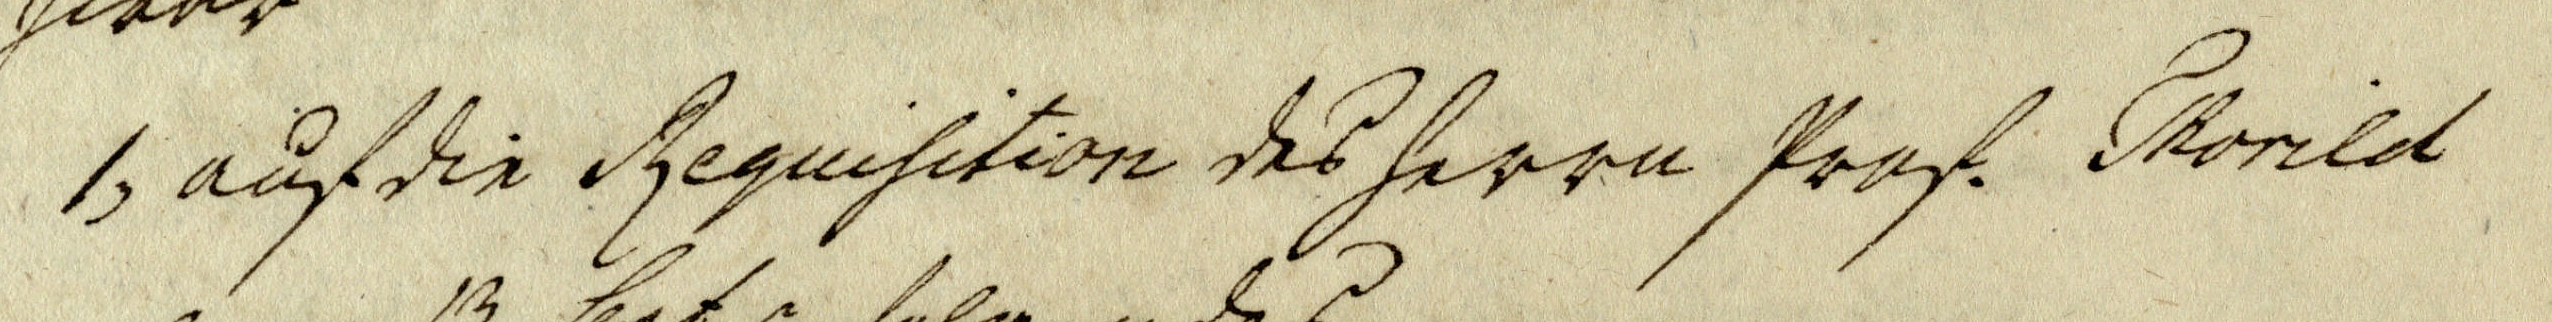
1. auf die Requisition des Herrn Prof. Thorild
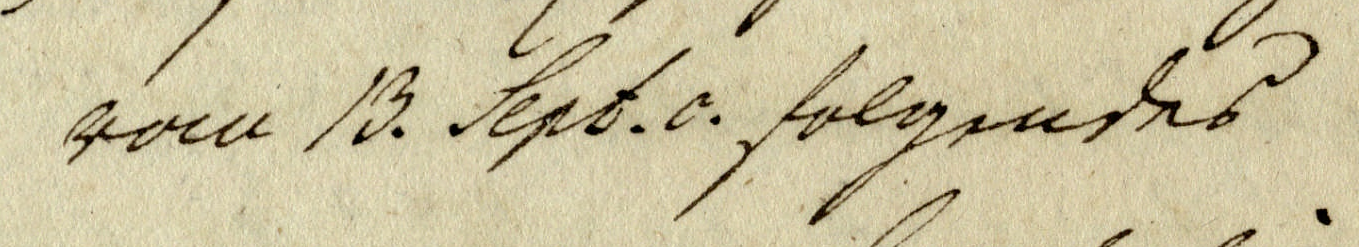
vom 13. Sept. c. folgendes
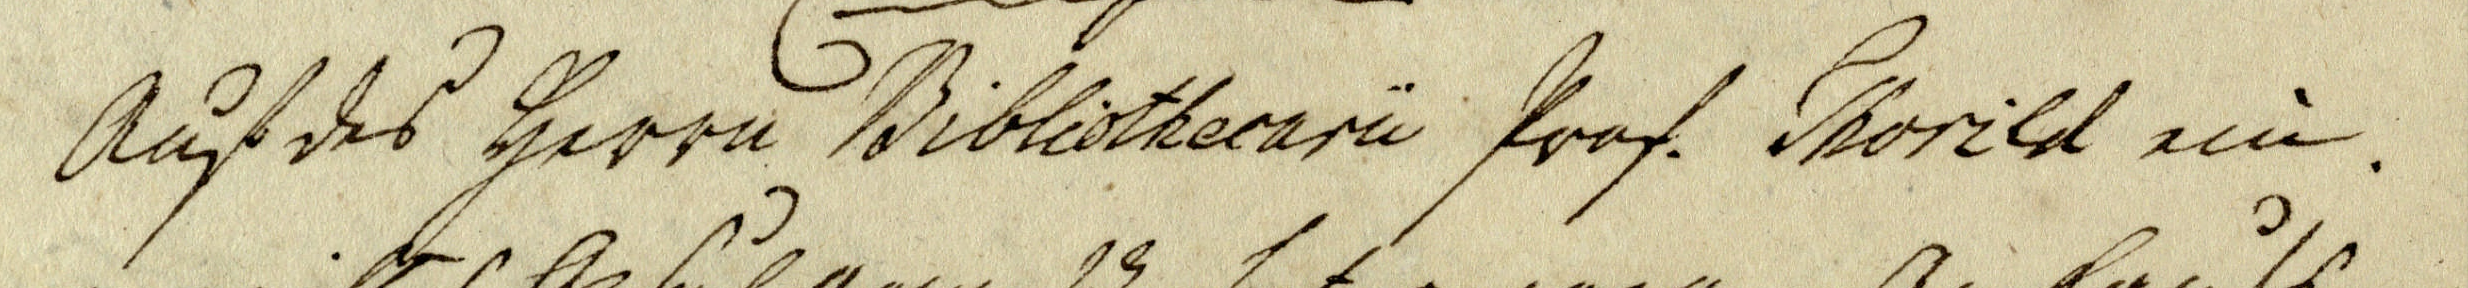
Auf des Herrn Bibleothecarii Prof. Thorild ein¬
